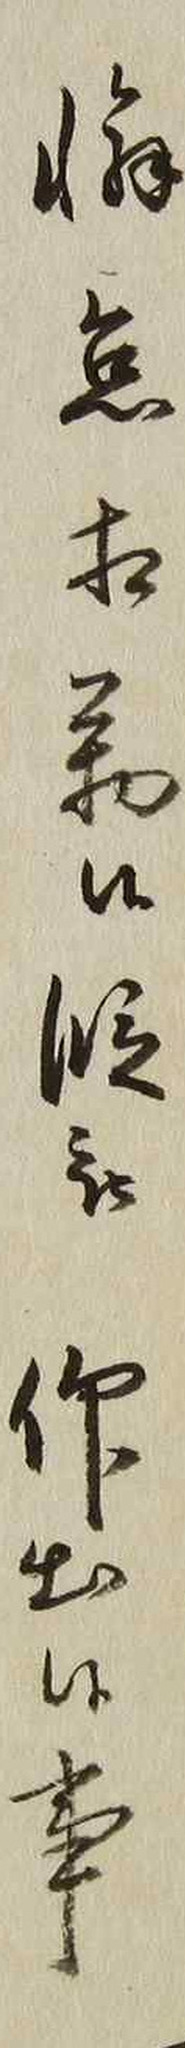懈怠相勤候段被仰出候事
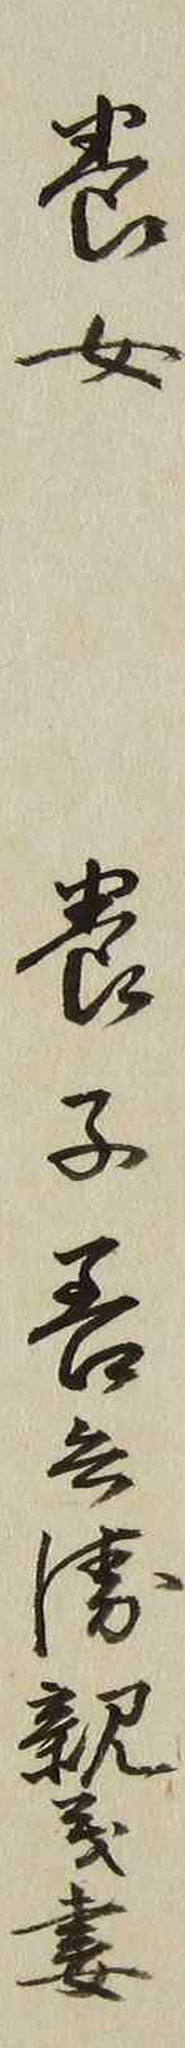養女養子善兵衛親義妻
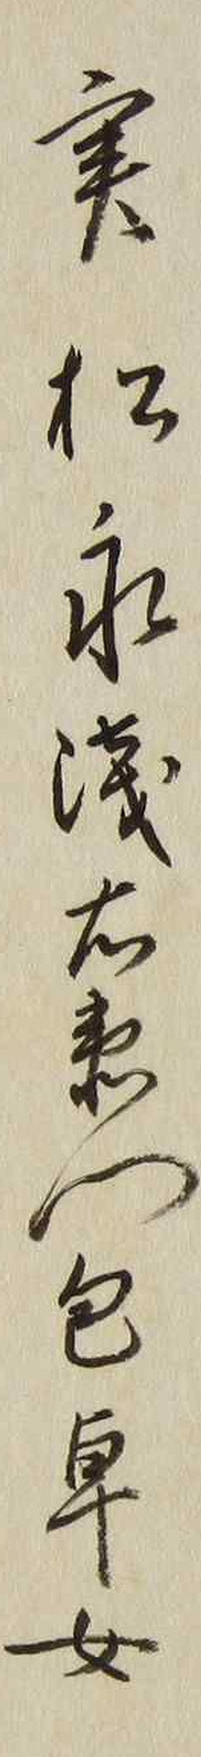実松永浅右衛門包卓女

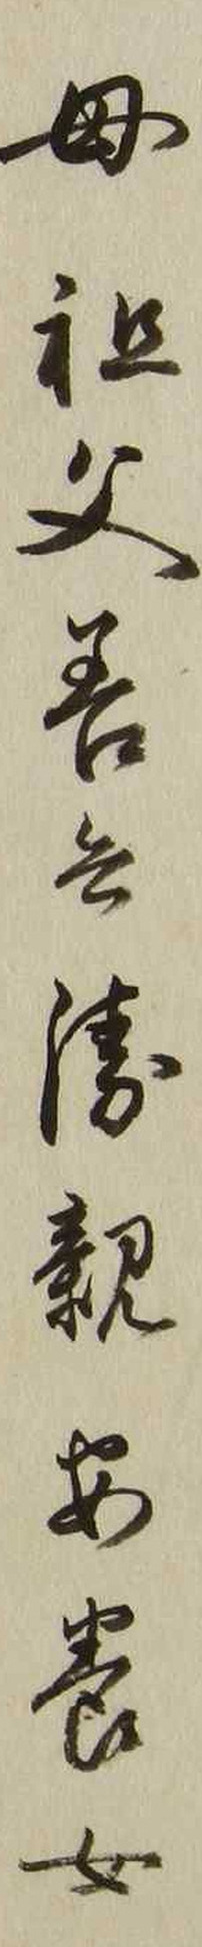母祖父善兵衛親安養女
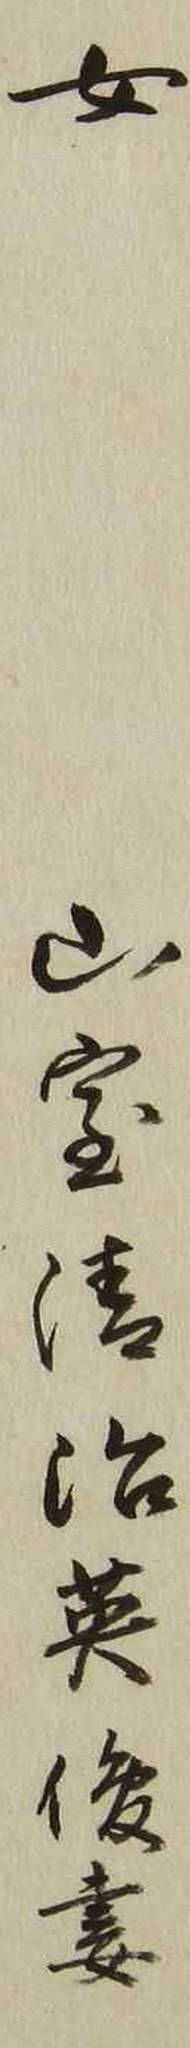女山室清治英俊妻
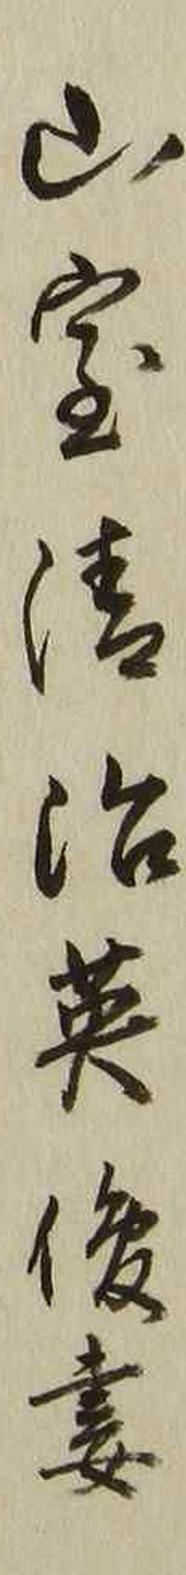女山室清治英俊妻
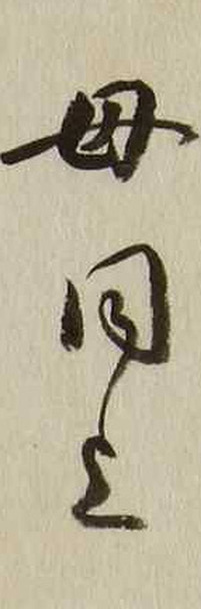母同上
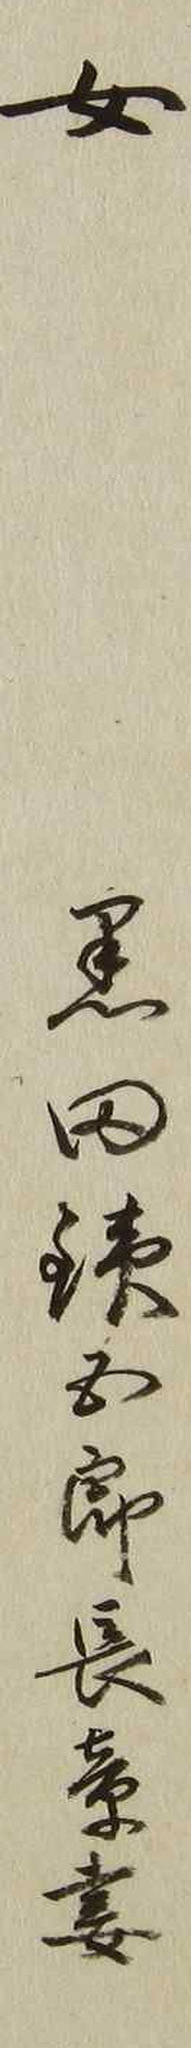女黒田鉄五郎長章妻
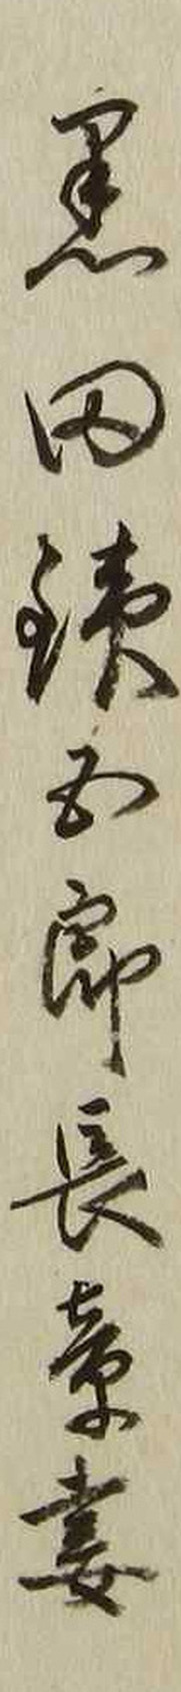女黒田鉄五郎長章妻
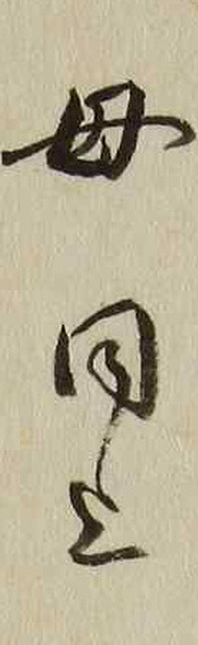母同上
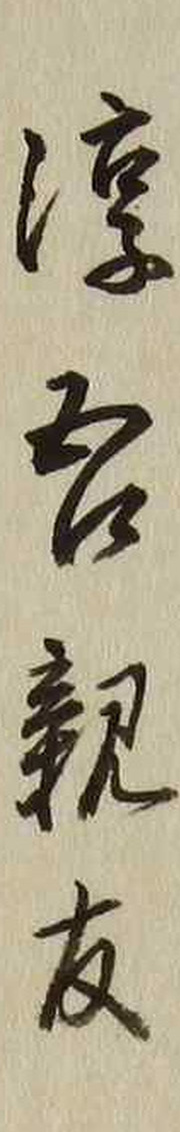淳吾親友
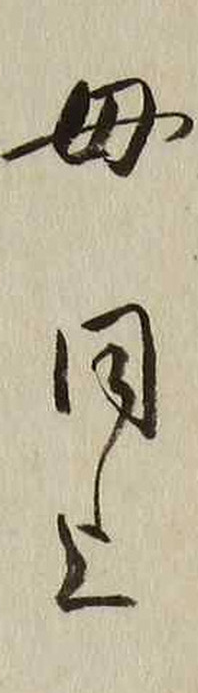母同上
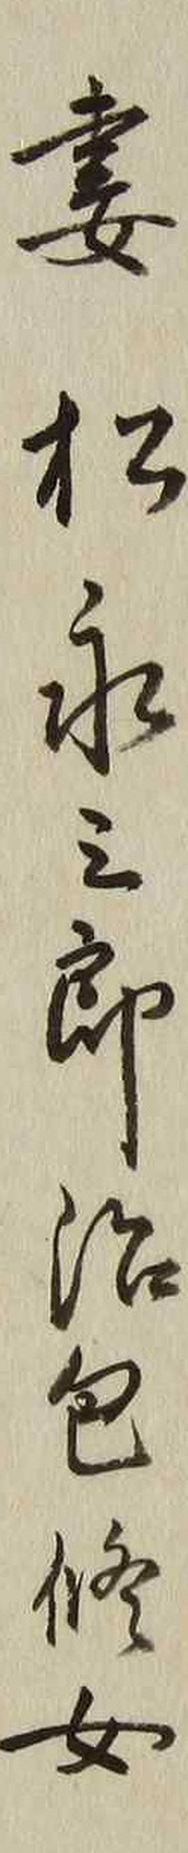妻松永三郎治包修女
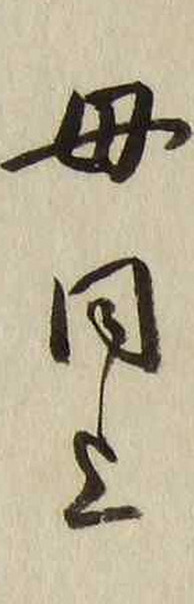母同上

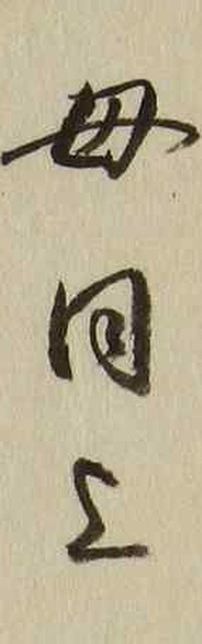母同上
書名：諸士系譜　巻之149　そ之部2
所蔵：会津若松市立会津図書館
